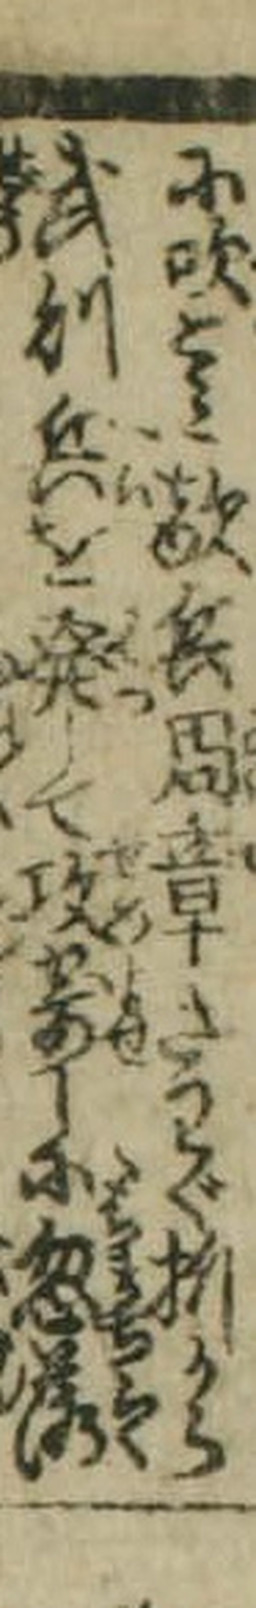武則兵を発して攻寄しに忽落
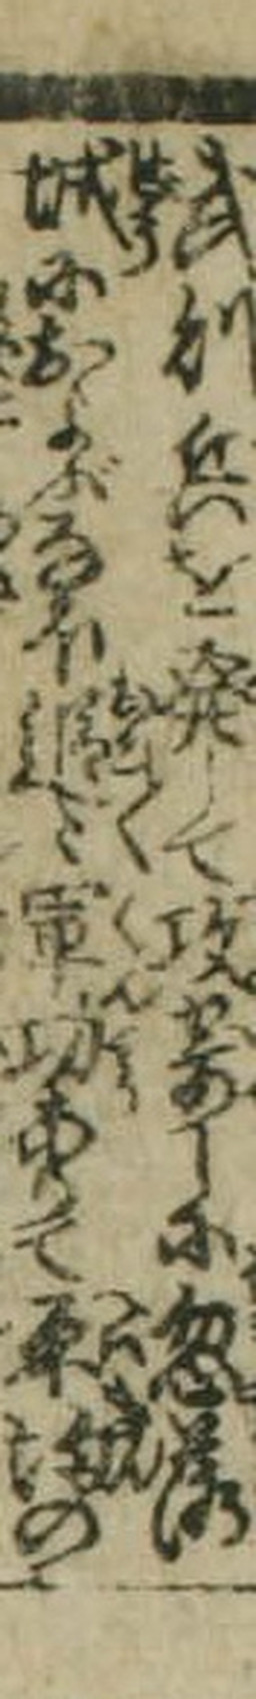城におよぶなほ追々軍功ありて平均の
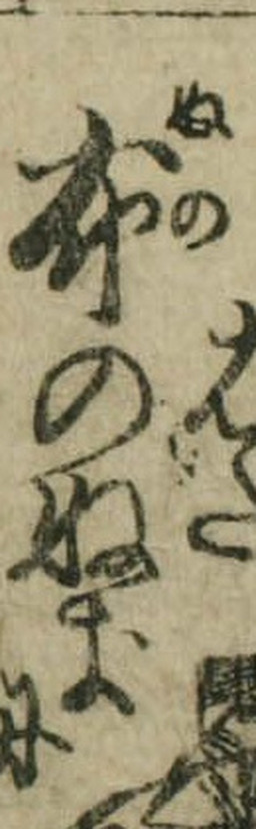布のぬきに
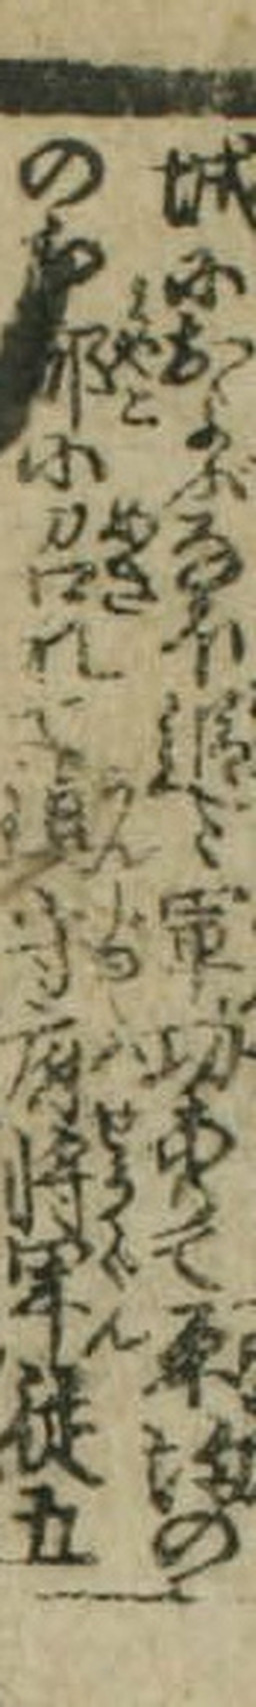のち都に召れて鎮守府将軍従五
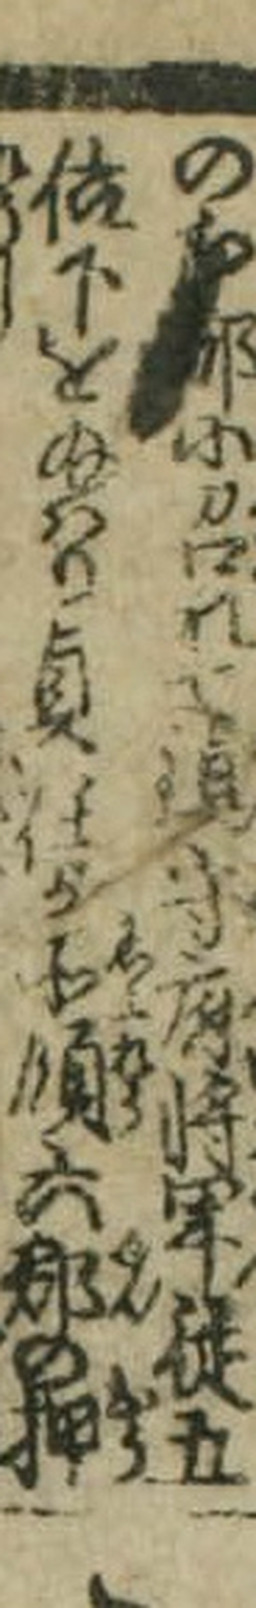位下を給はり貞任か所領六郡の押
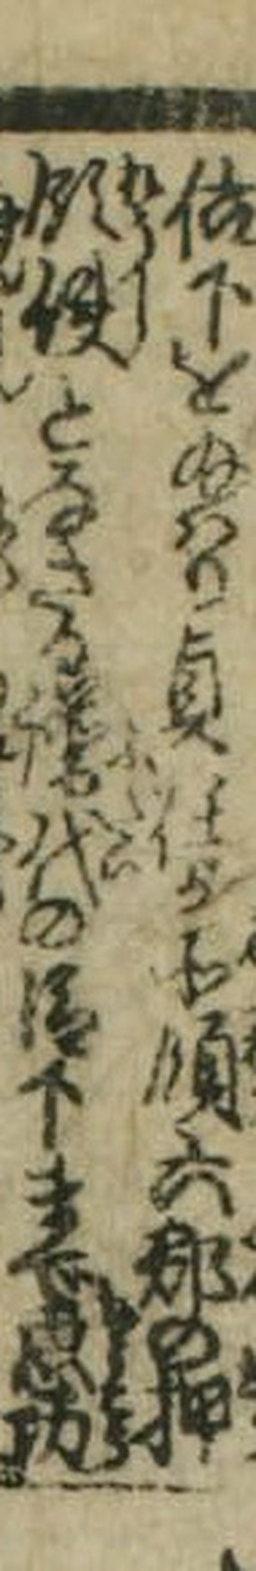領使となさる譜代の臣下まで忠功
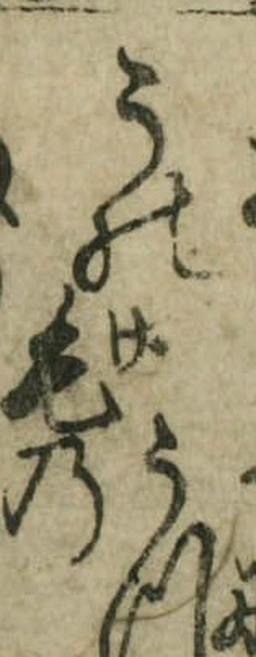うの毛の
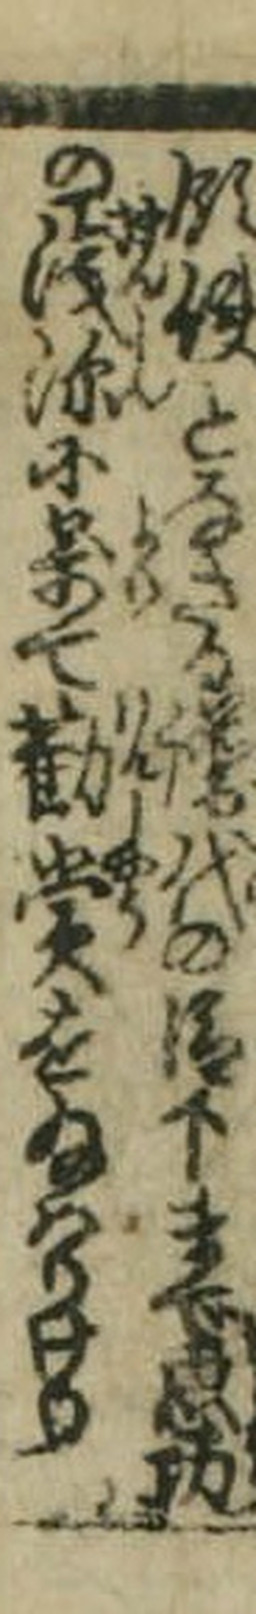の浅深に寄て勧賞を給はりけり
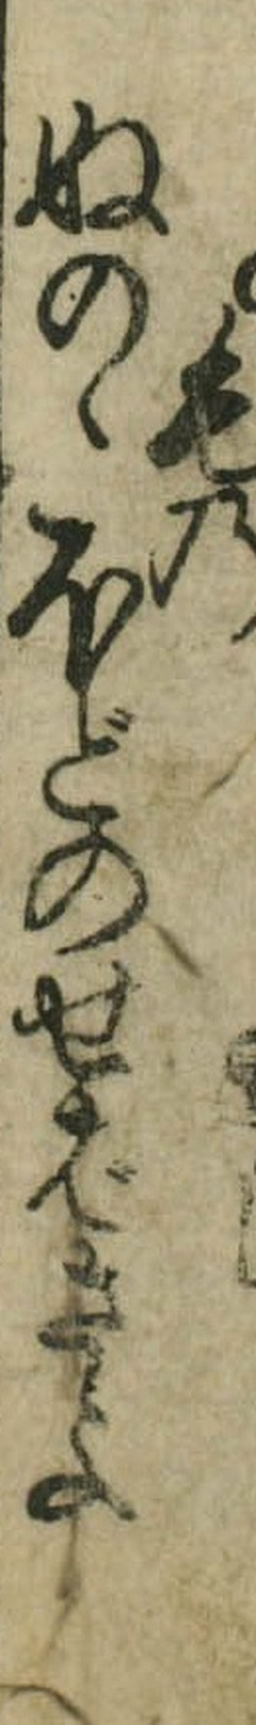ぬのゝほどのせばさよ
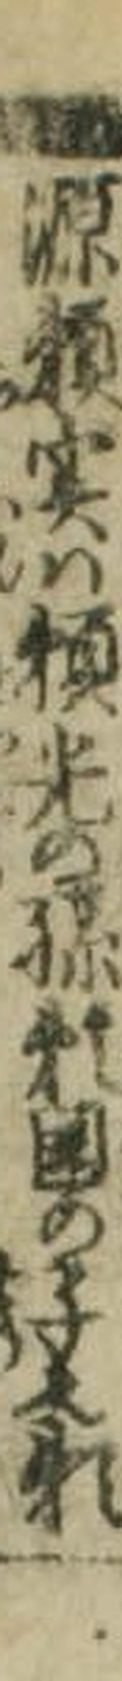源頼実は頼光の孫頼国の子也頼
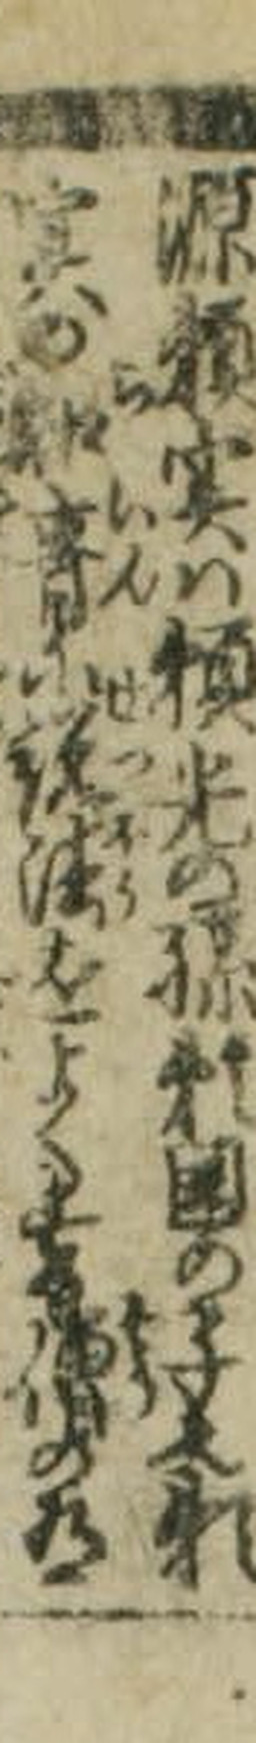実の知音に説法をよくする僧の有
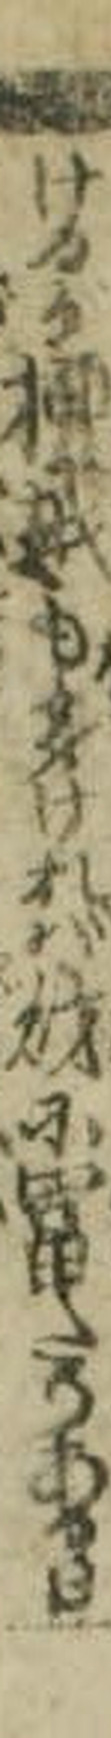けるが檀越も多ければ財に富たりある日
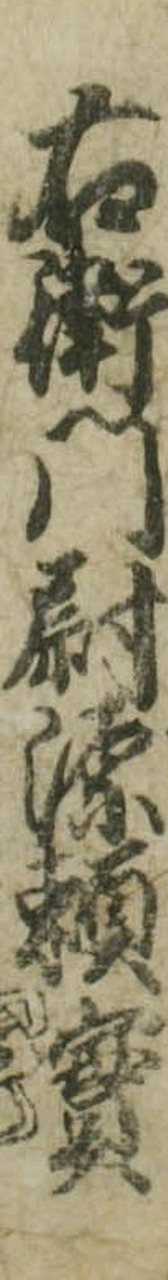右衛門尉源頼実
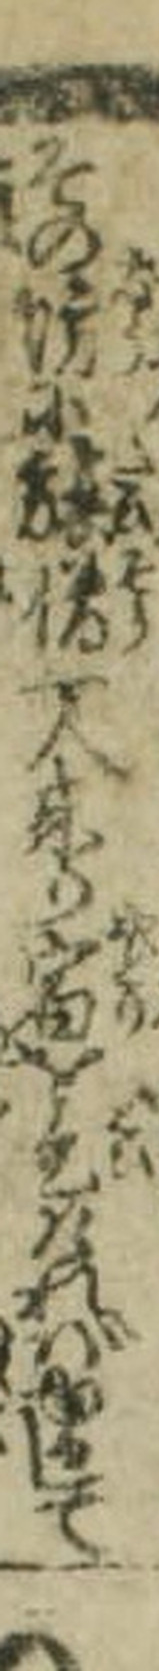その坊に旅僧一人来り宿を乞ければゆるして
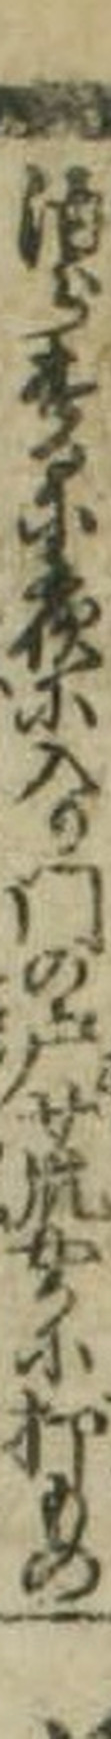泊らするに夜に入り門の戸荒やかに叩もの
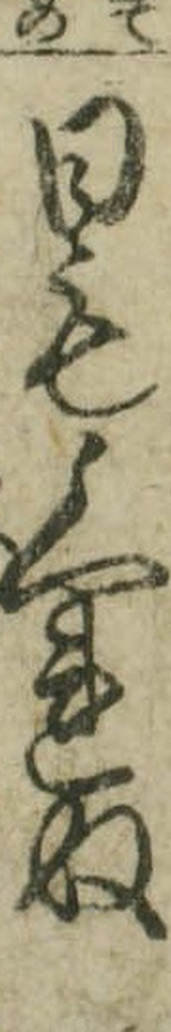日もくれぬ
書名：續英雄百人一首
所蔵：東京学芸大学附属図書館
